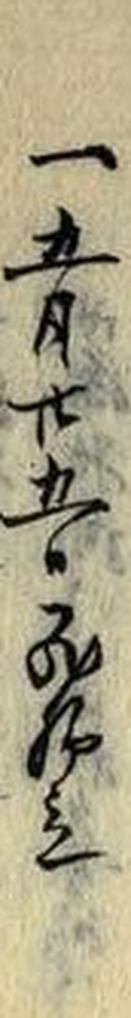一五月廿五日飛脚立
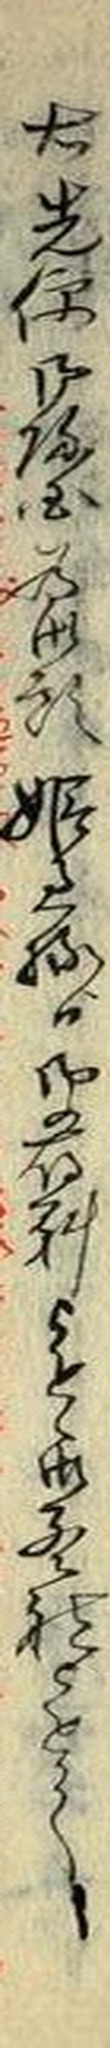右先便御帰国為御歓姫君様ゟ御肴料被進之御答礼被進之
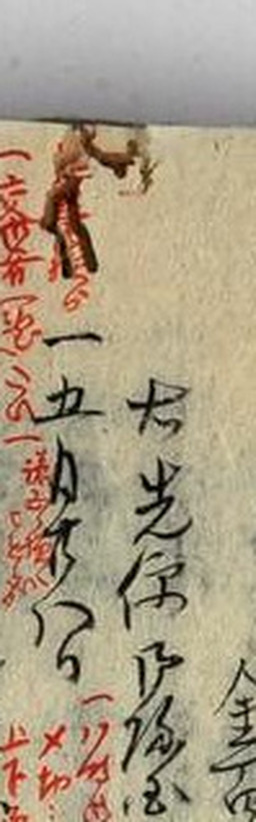一五月廿八日
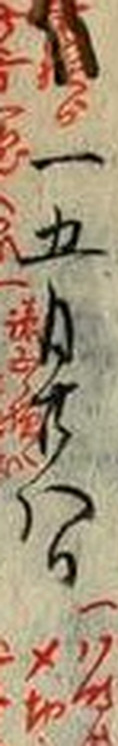一五月廿八日
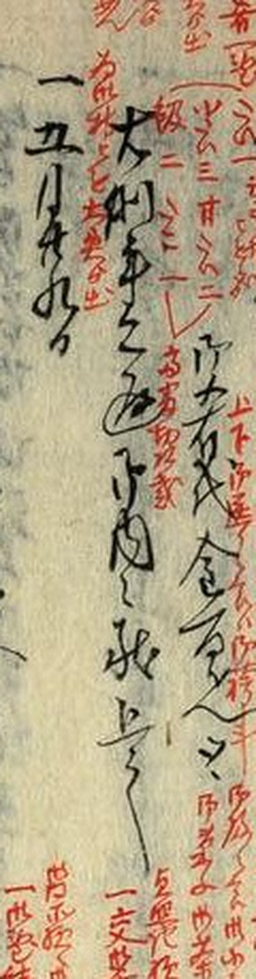右例年之通御内々献上之
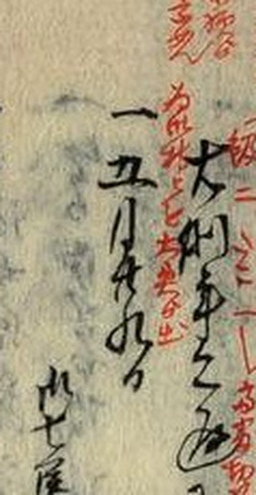一五月廿九日
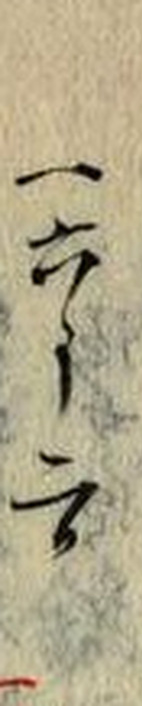一六月二日
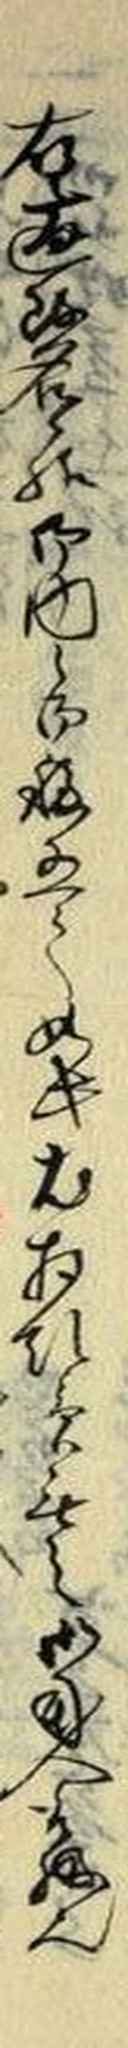右之通改名候様御内々御移有之如此尤拝領ニ而ハ無之御用人取扱也
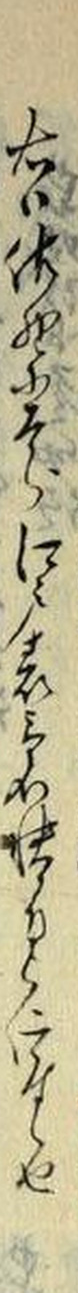右ハ佐野小太郎江戸表ニ而不快ニ付被仰付候由
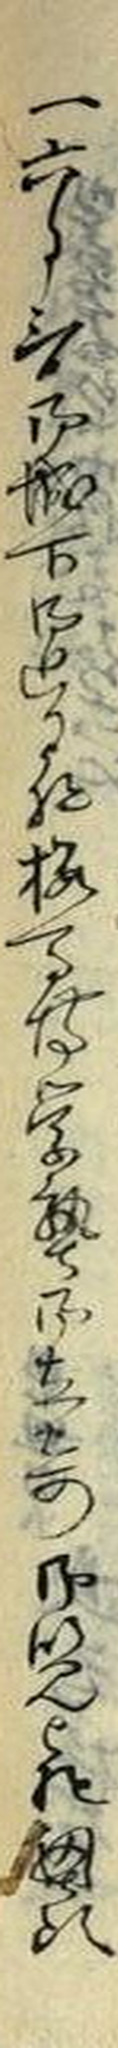一六月三日御城下御廻り被遊桜馬場学塾御立寄御覧被遊塾頭
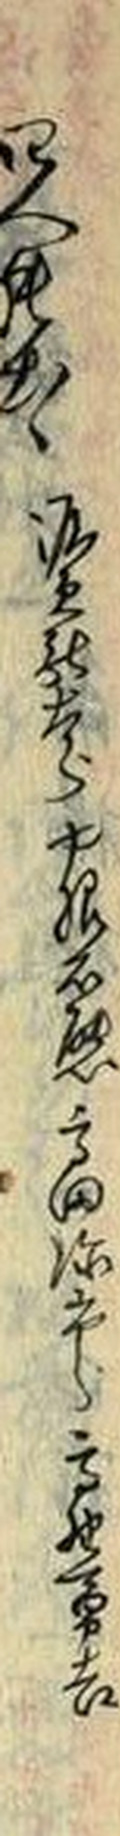四人罷出候渥美新太郎中根不態高田弥市郎高野勇吉
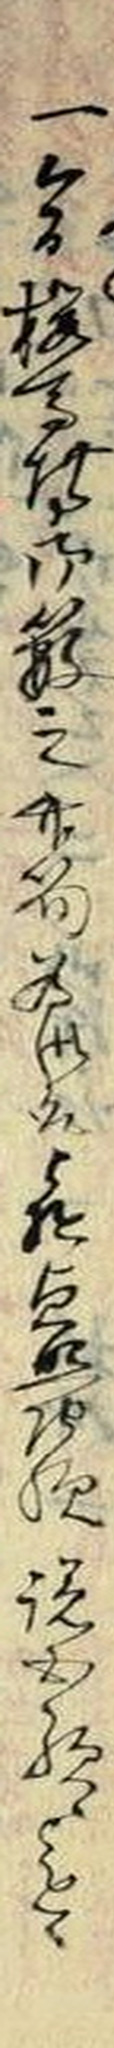一今日桜馬場御薮之竹筍為御取被遊貞照院様謙五郎様へ被進候
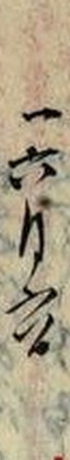一六月六日
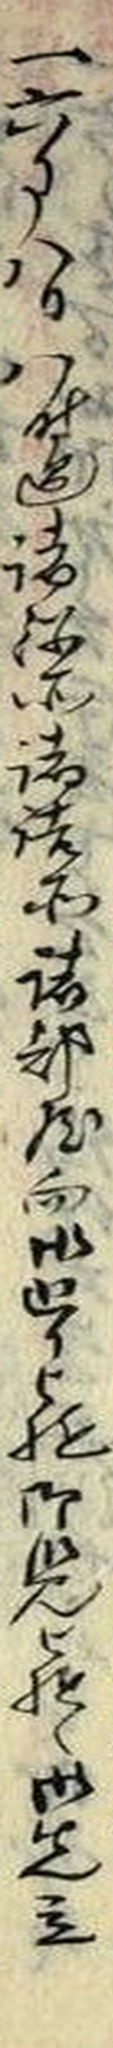一六月八日八時過諸役所諸詰所諸部屋向御廻り被遊御覧被遊候御先立
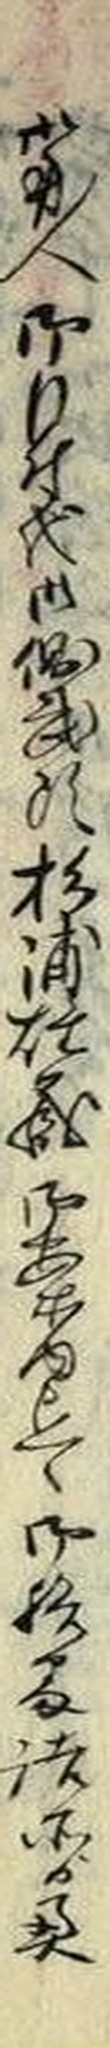御用人御目付代御側武頭杉浦雄蔵御案内申上候御膳番諸所ゟ奥
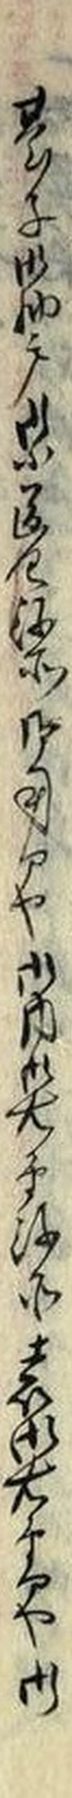台子御納戸御小道具役所御用部や御内御右筆役所表御右筆部や御
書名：少傅日録抄（斉承付側向頭取日記、在国）
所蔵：福井県文書館 Fukui Prefectural Archives
